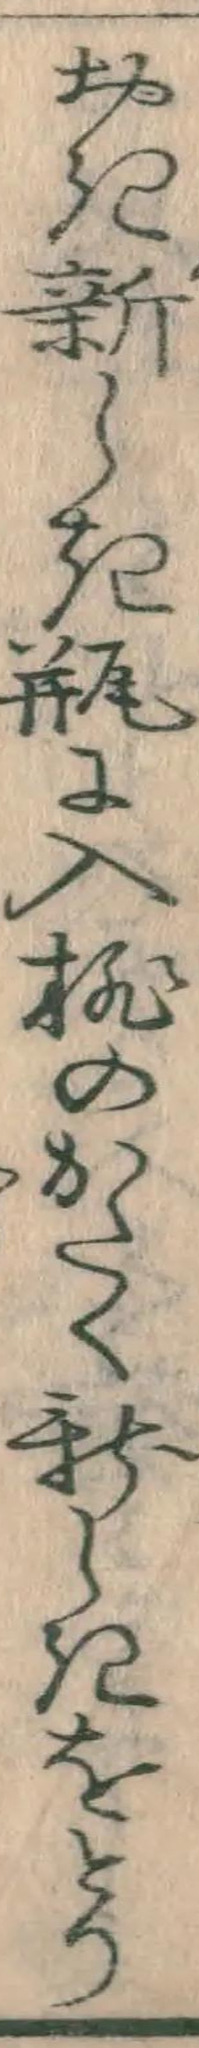おき新しき瓶に入桃のかたく新しきをとり
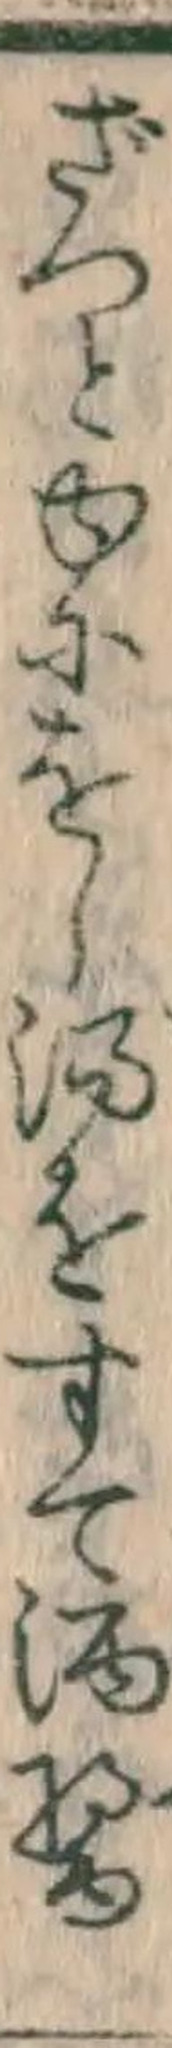ざつとゆにをし湯をすて酒醬
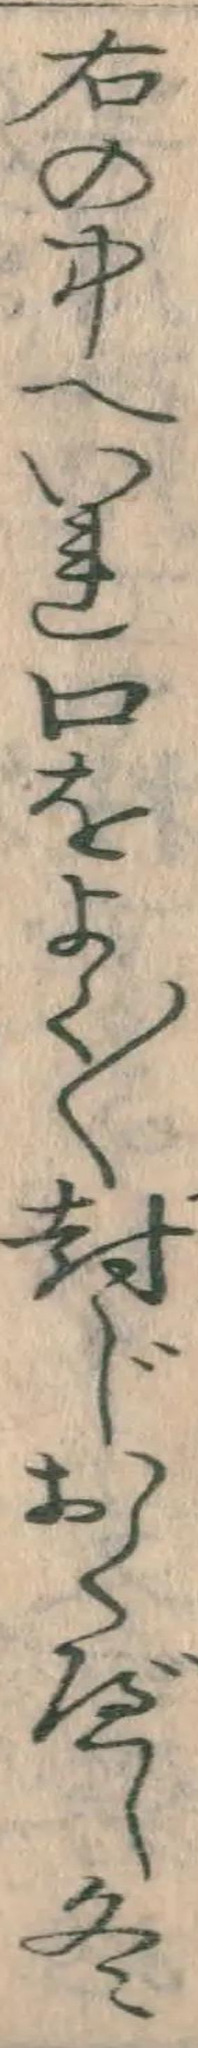右の中へいれ口をよく〳〵封じおくべし冬
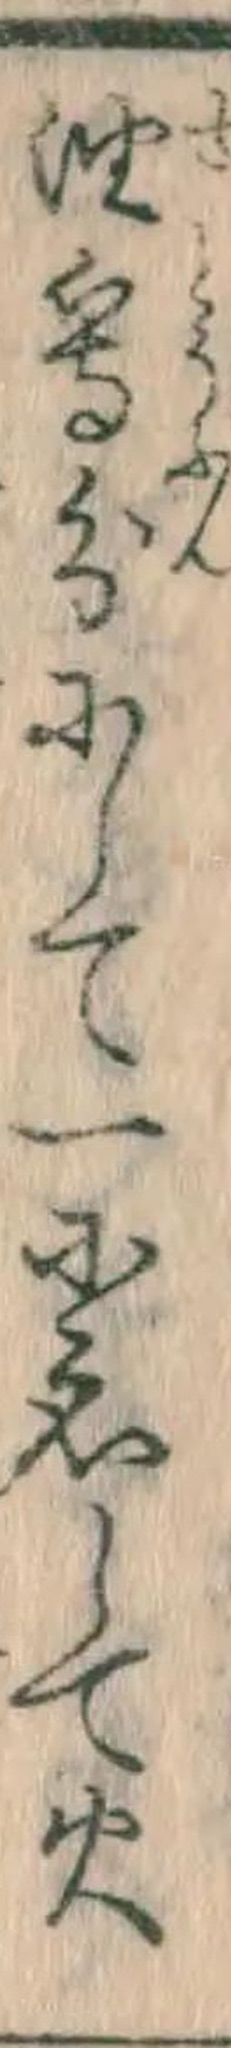油等分にして一にえして火
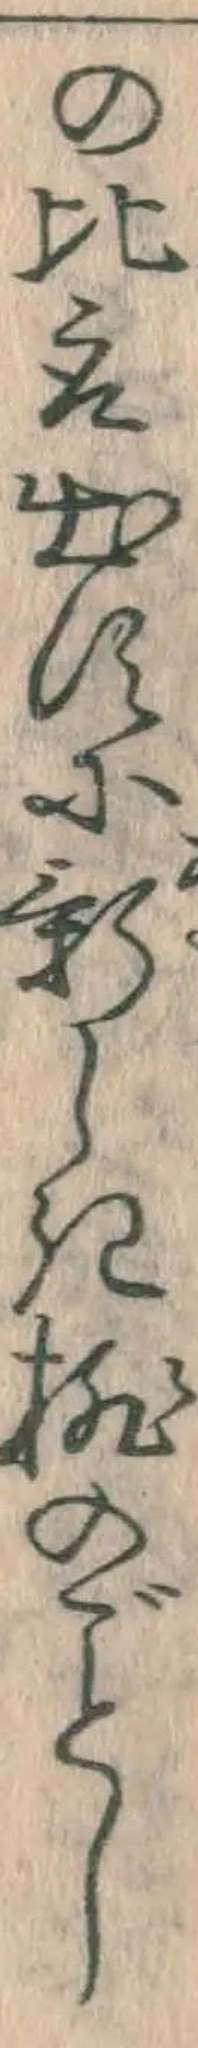の比取出すに新しき桃のごとし
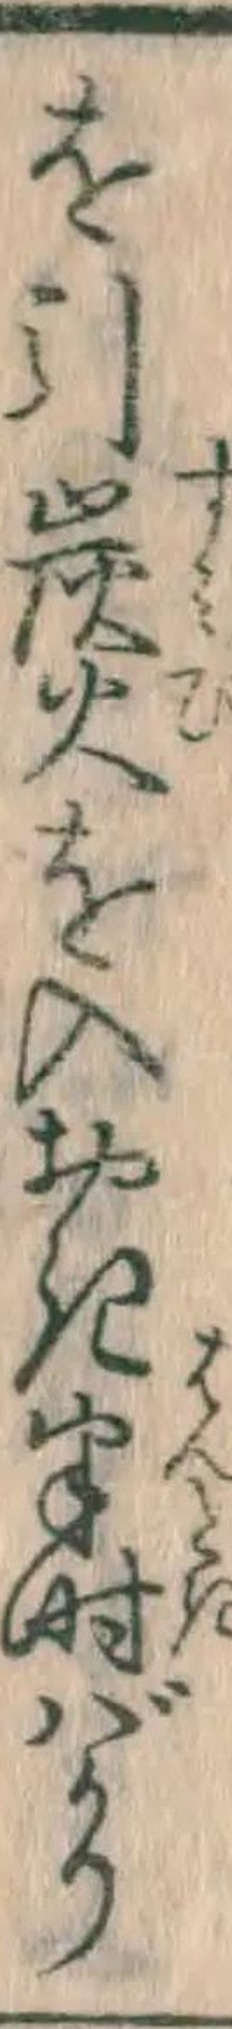を引炭火を入おき半時ばかり
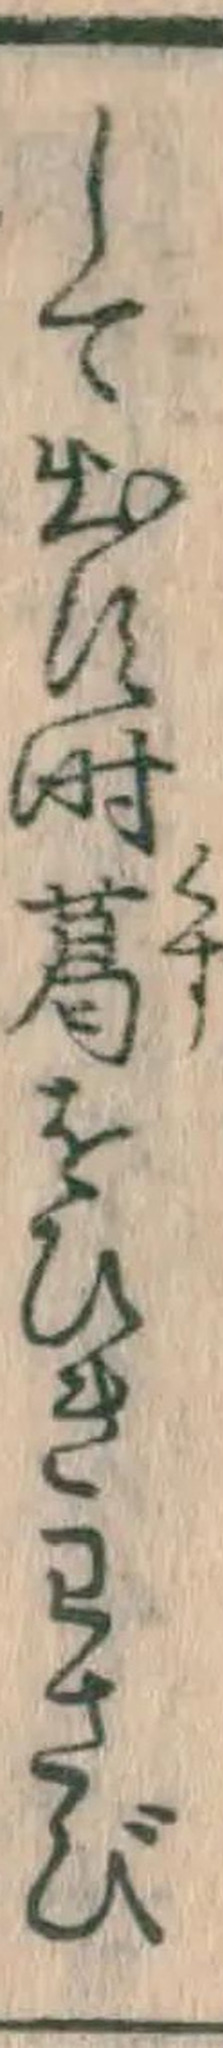して出す時葛をひきわさび
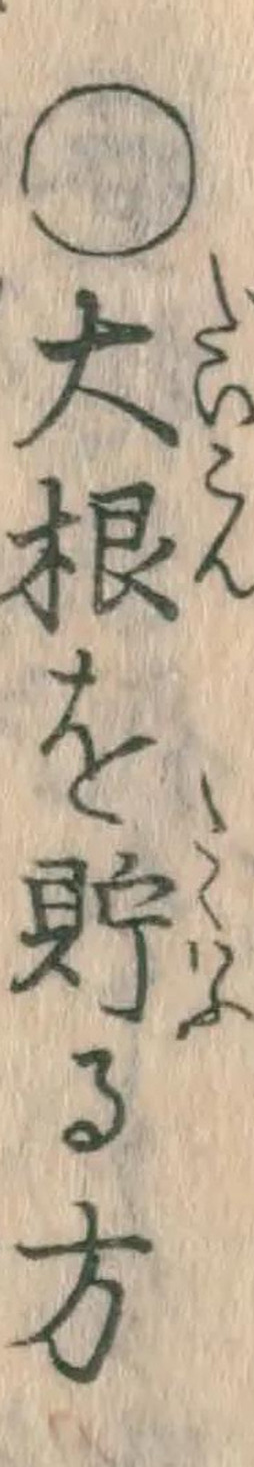○大根を貯る方
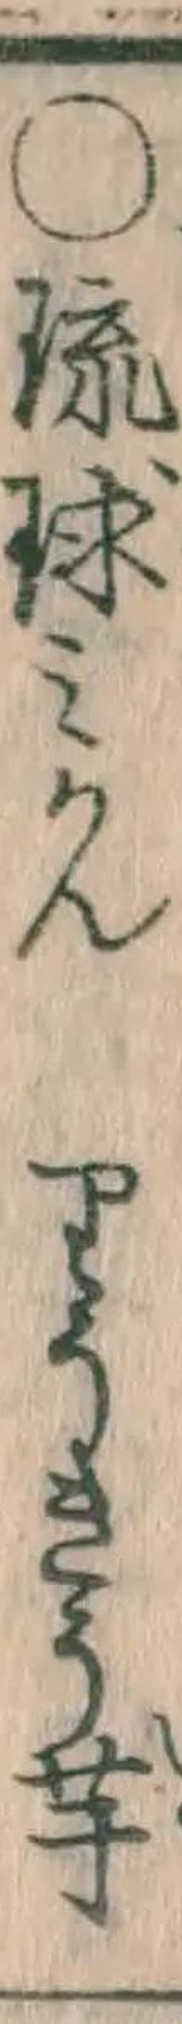○琉球みかんりうきう芋
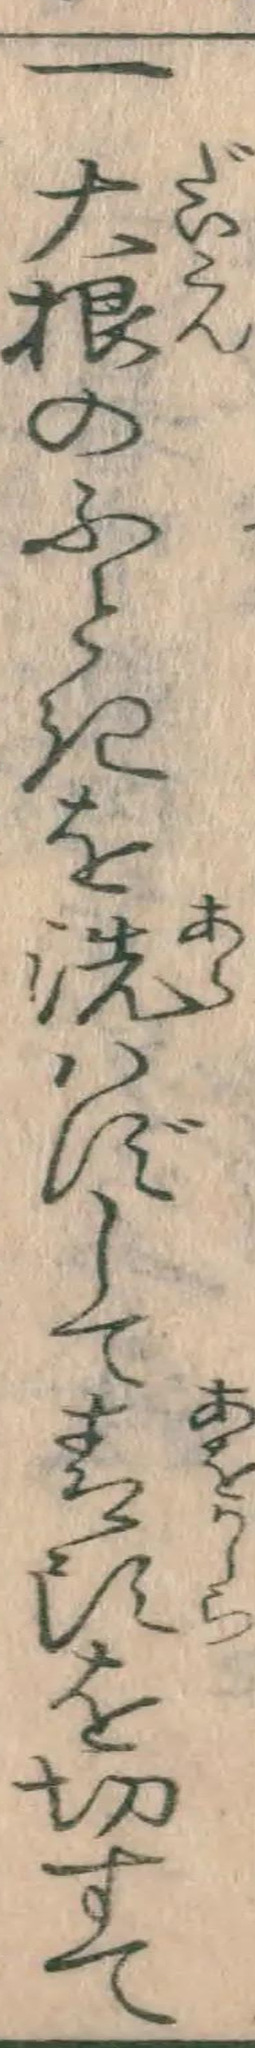一大根のふときを洗はずして青頭を切すて
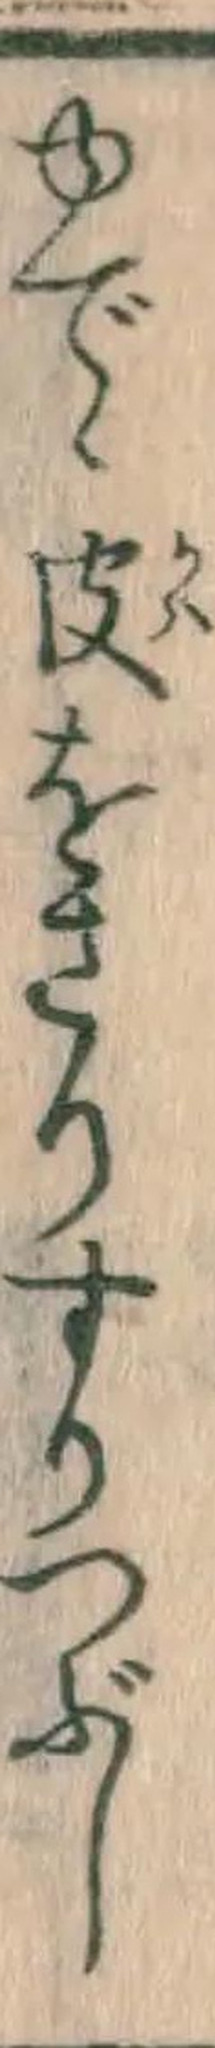ゆでゝ皮をさりすりつぶし
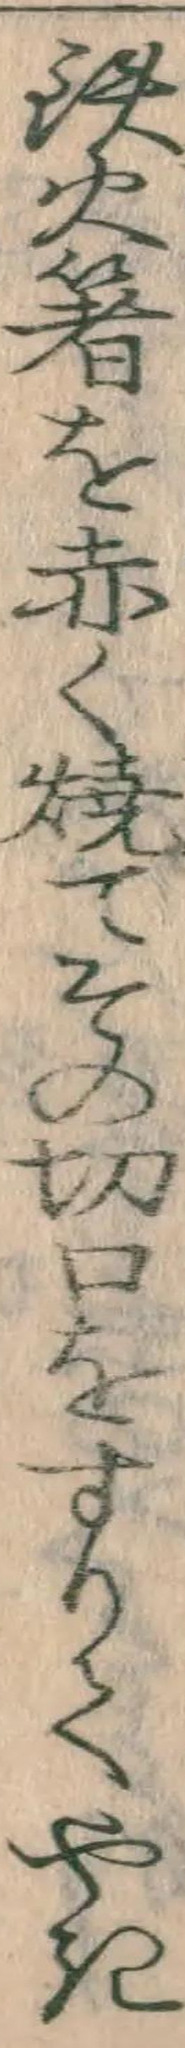鉄火箸を赤く焼てその切口をすりてやき
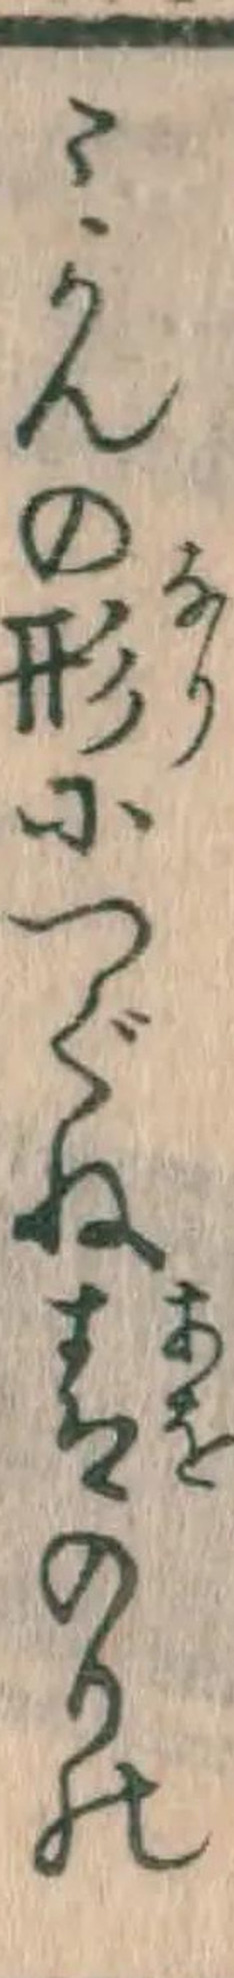みかんの形につぐね青のりの
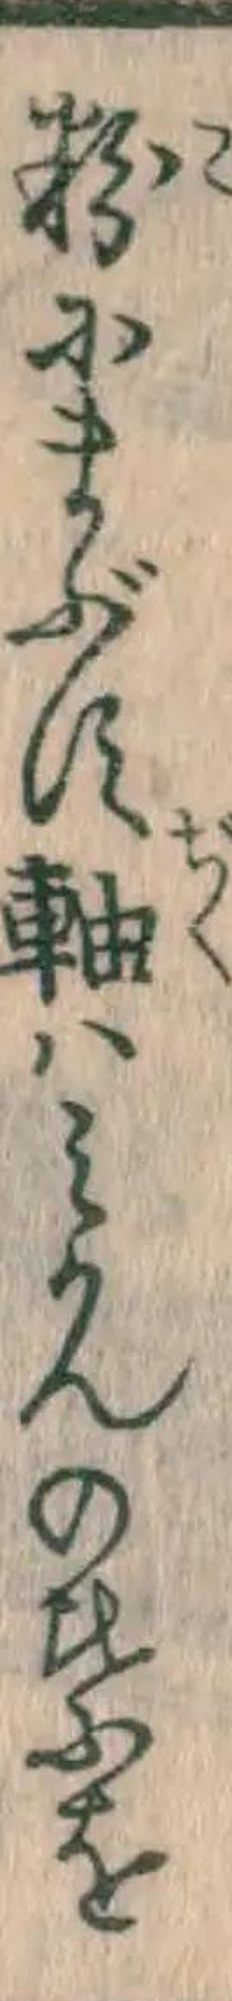粉にまぶす軸はみかんの葉を
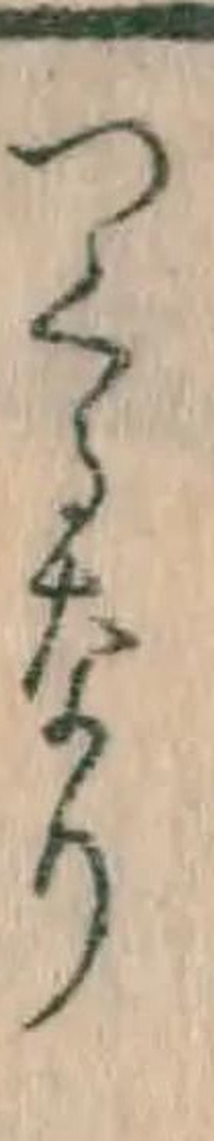つくるなり
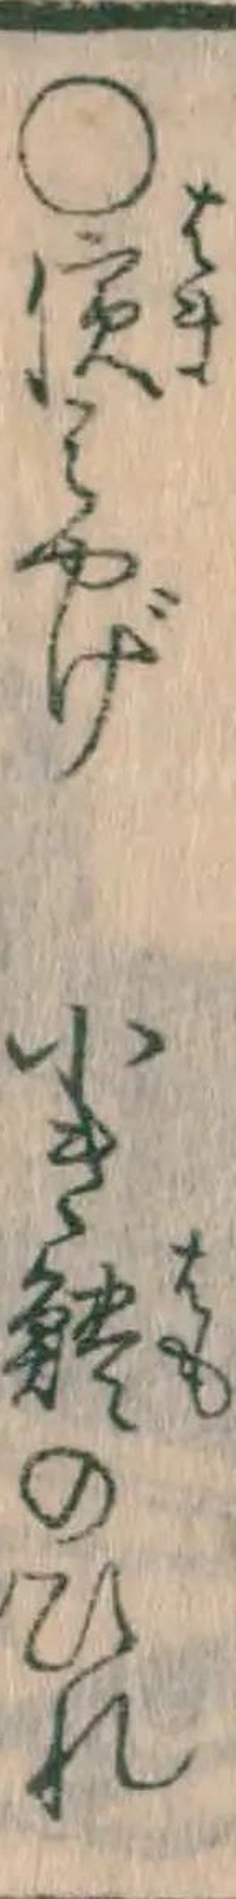○浜みやげ小き鱧のひれ
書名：広益秘事大全 3巻. [5]
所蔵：国立国会図書館 National Diet Library, JAPAN
